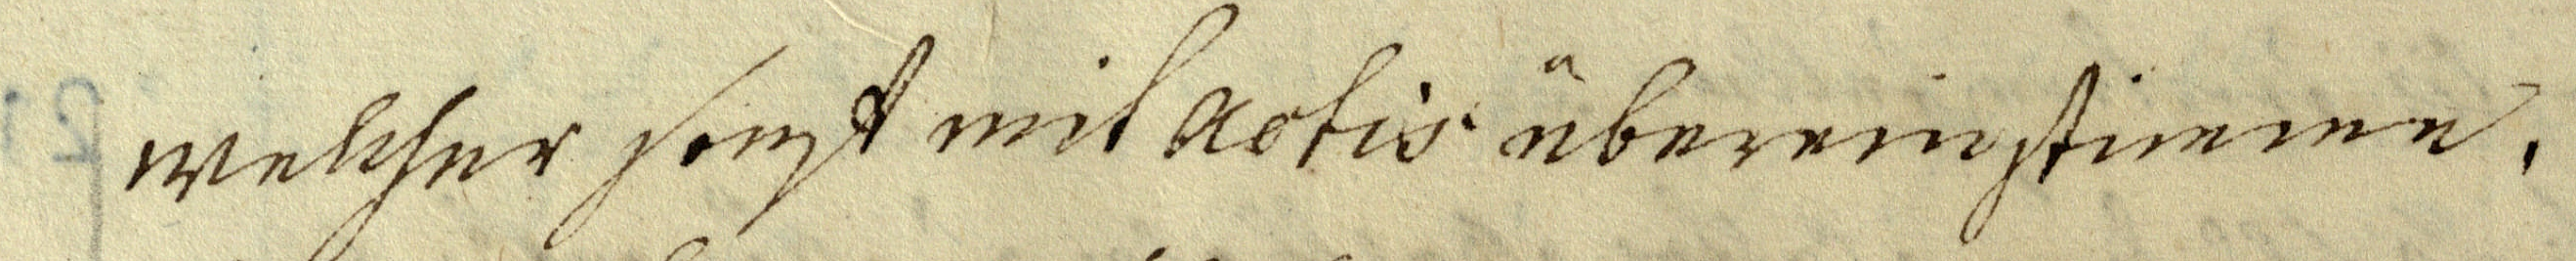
welcher sonst mit actis übereinstimme,
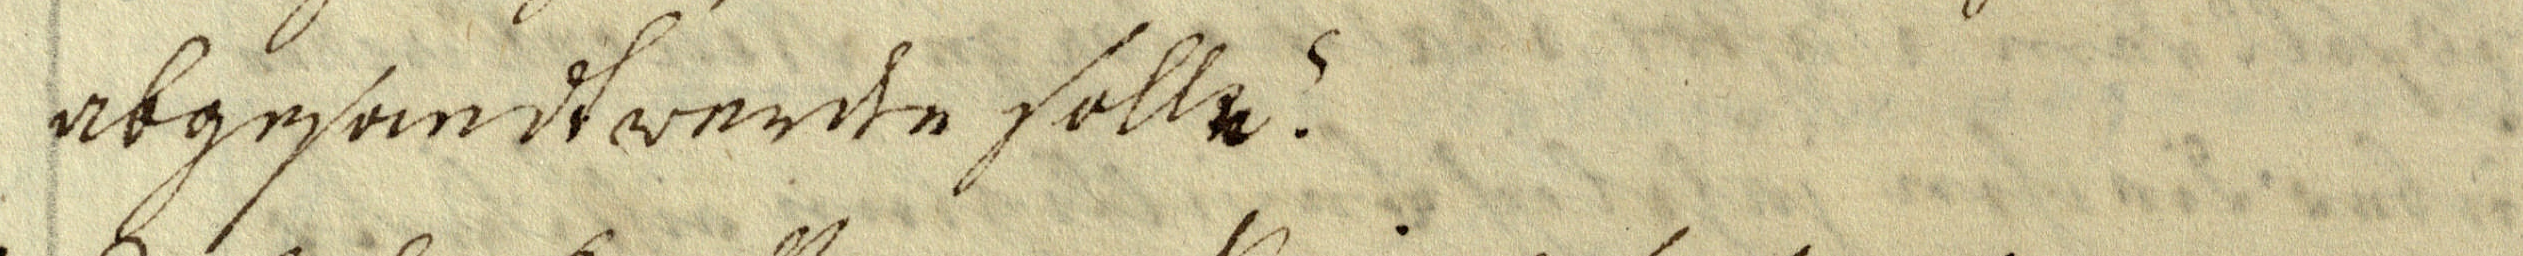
abgesandt werden solle?
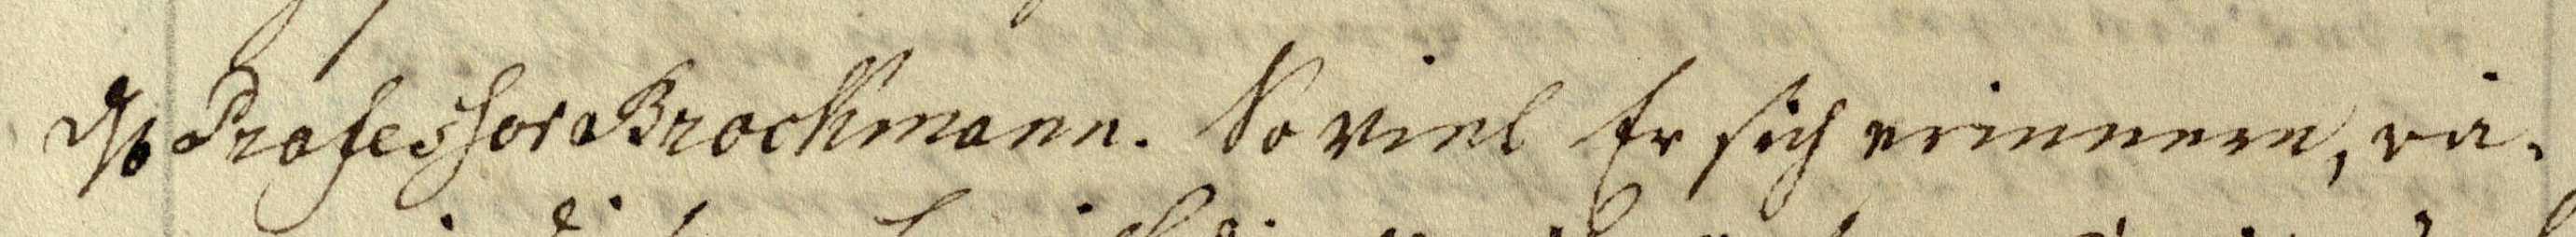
dh Professor Brockmann. So viel Er sich erinnere, wä¬
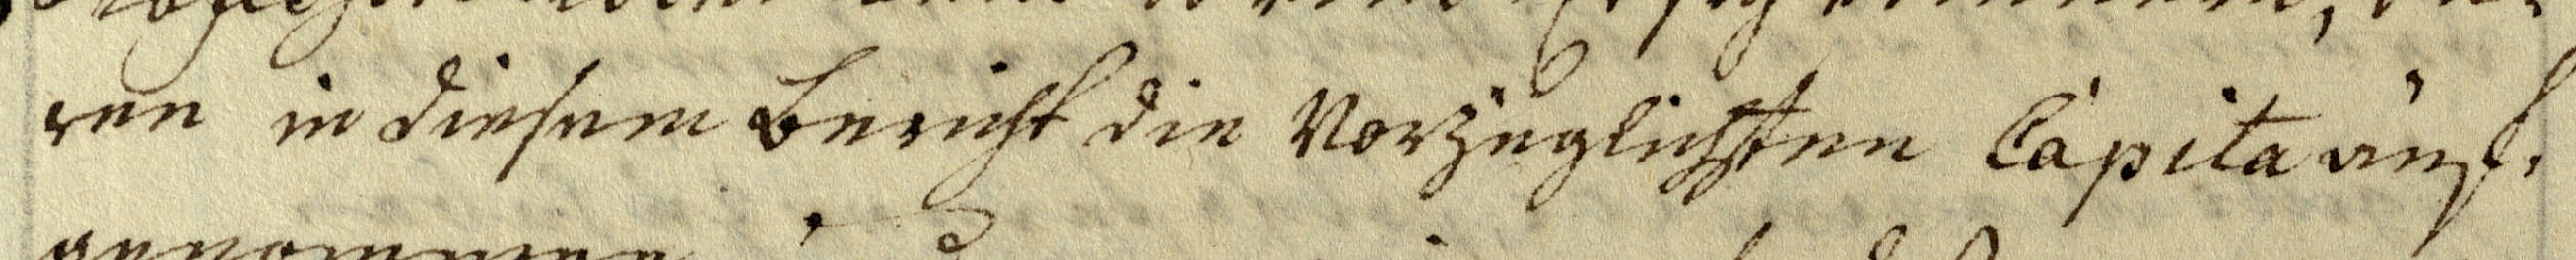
ren in diesem Bericht die vorzüglichsten Capita auf¬
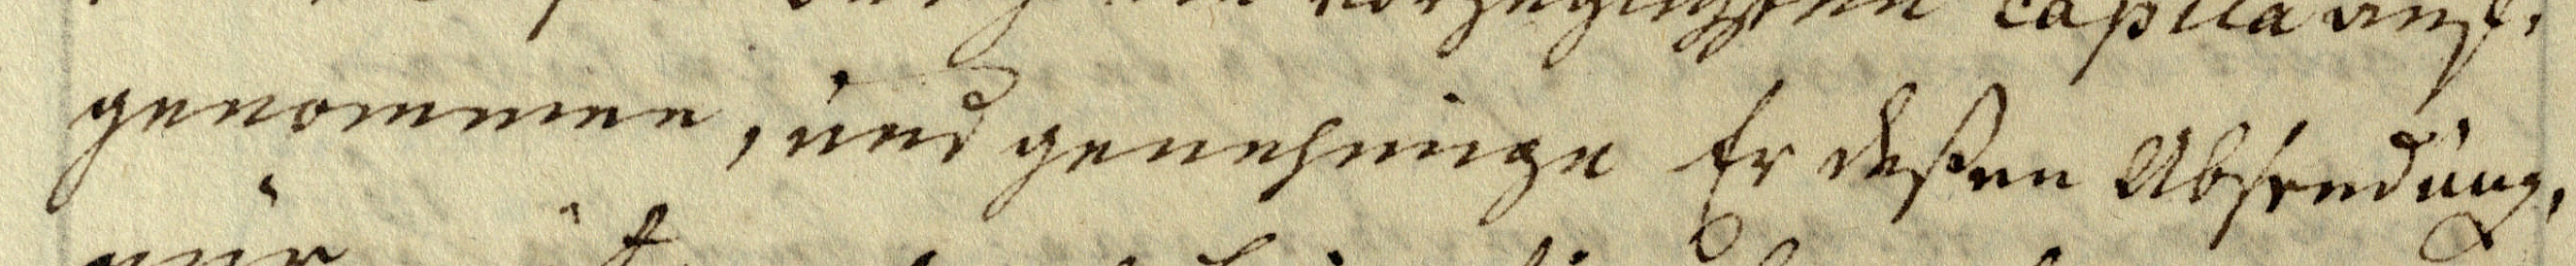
genommen, und genehmige Er deßen Absendung,
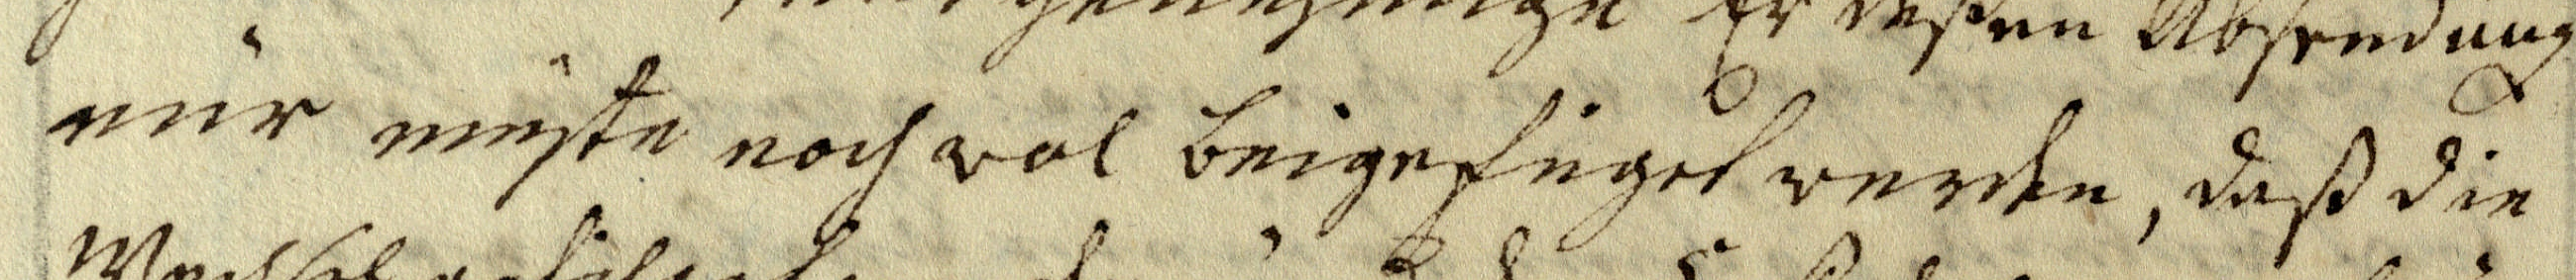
nur müste noch wol beigefüget werden, daß die
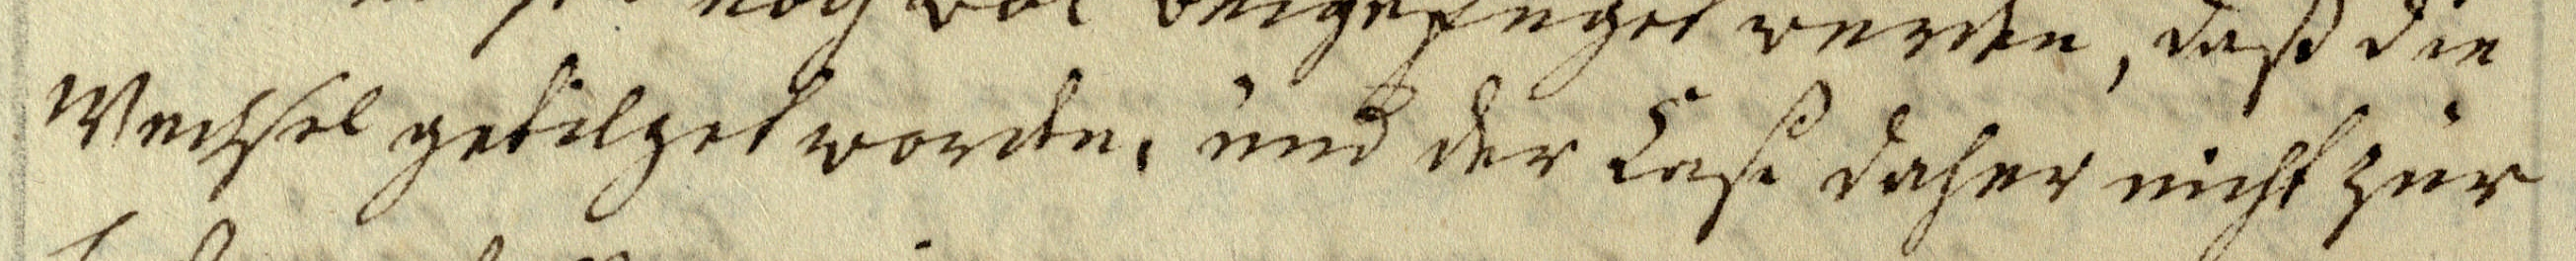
Wechsel getilget worden, und der Caße daher nicht zur
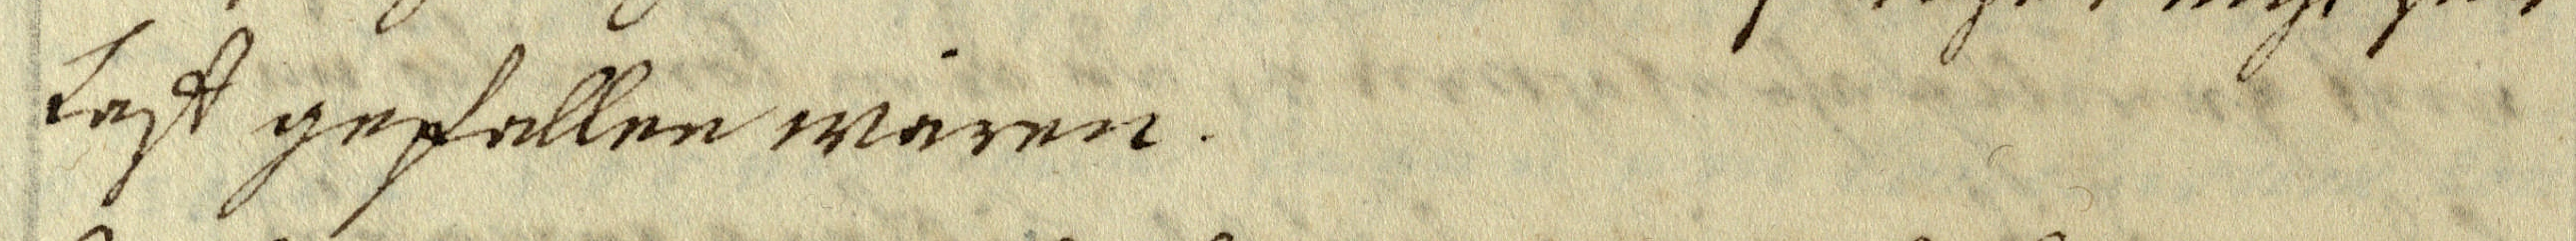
Last gefallen wären.
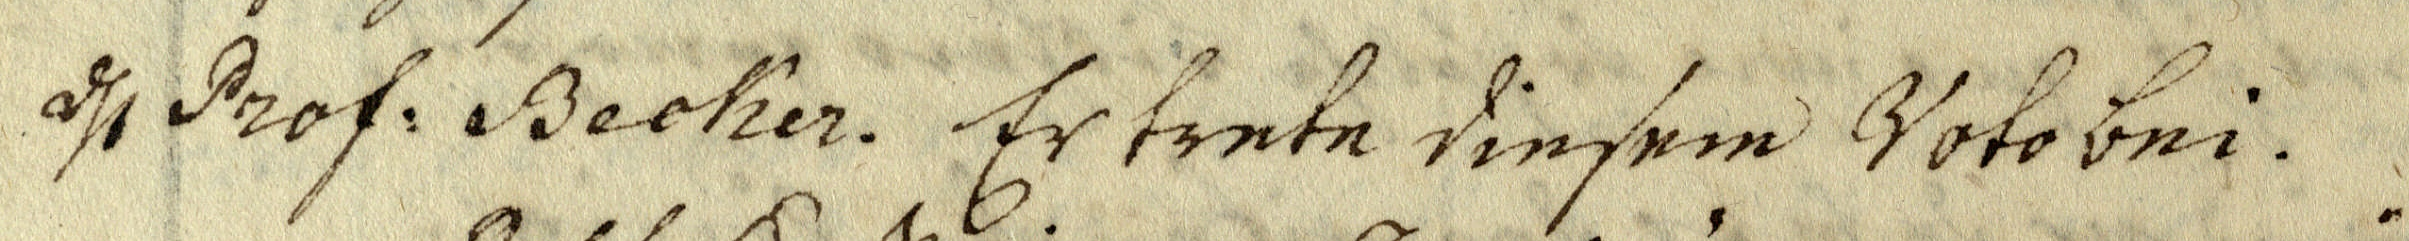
dh Prof. Becker. Er trete diesem Voto bei.
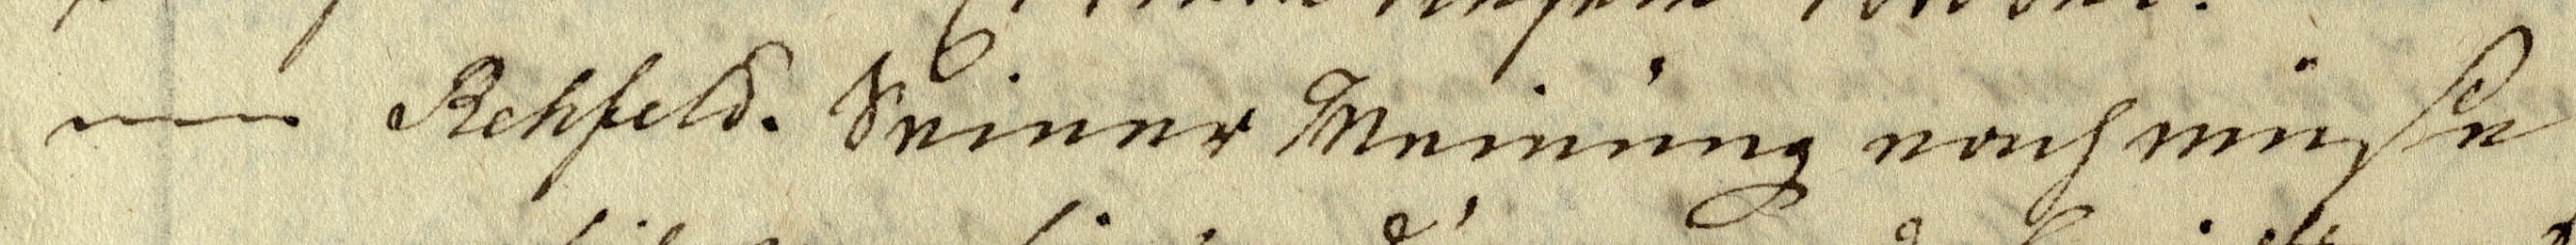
Rehfeld. Seiner Meinung nach müße
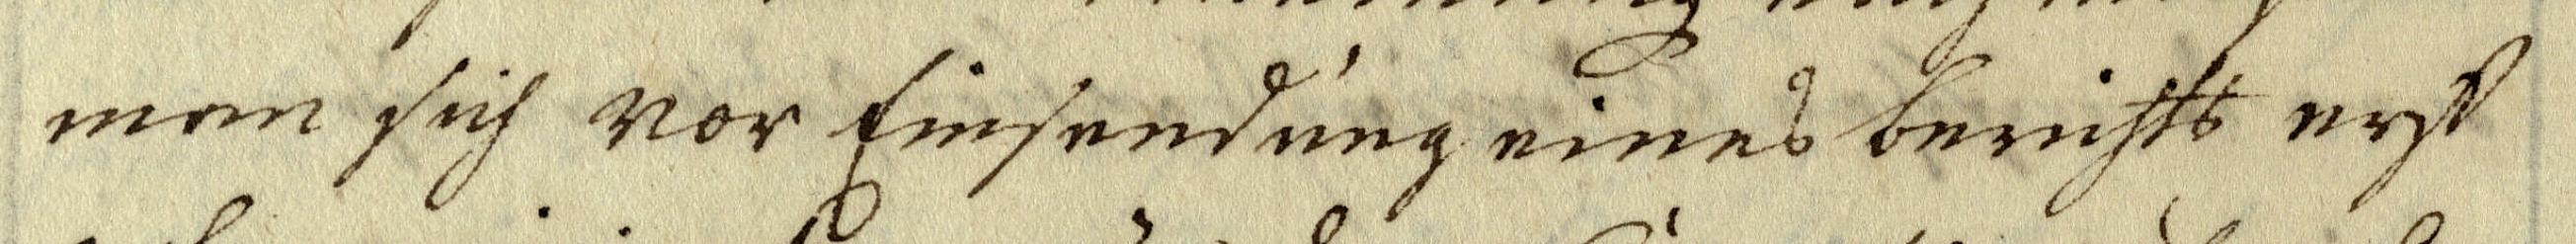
man sich vor Einsendung eines Berichts erst
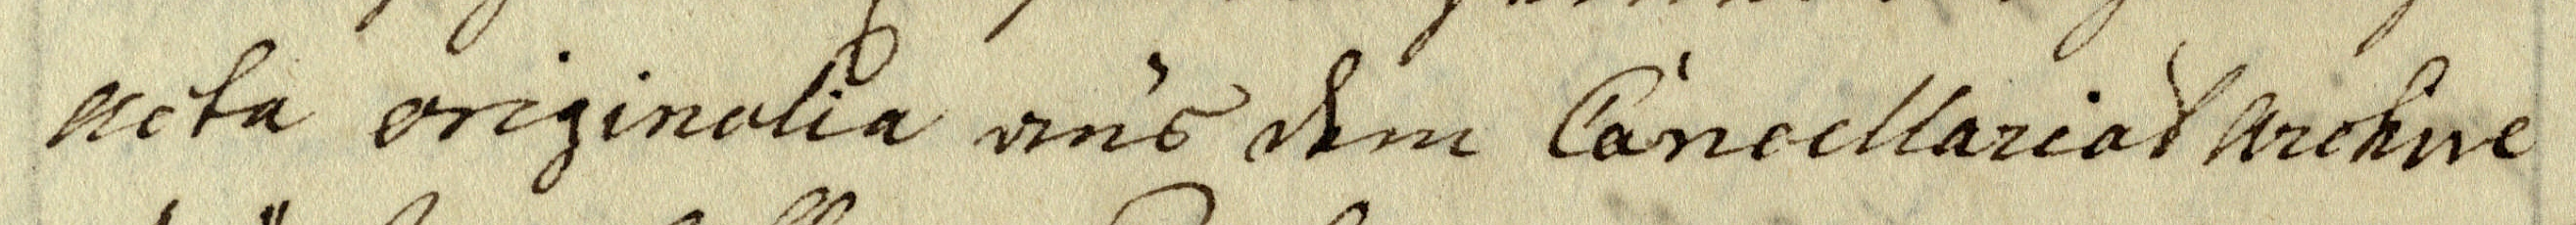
acta originalia aus dem Cancellariat Archive
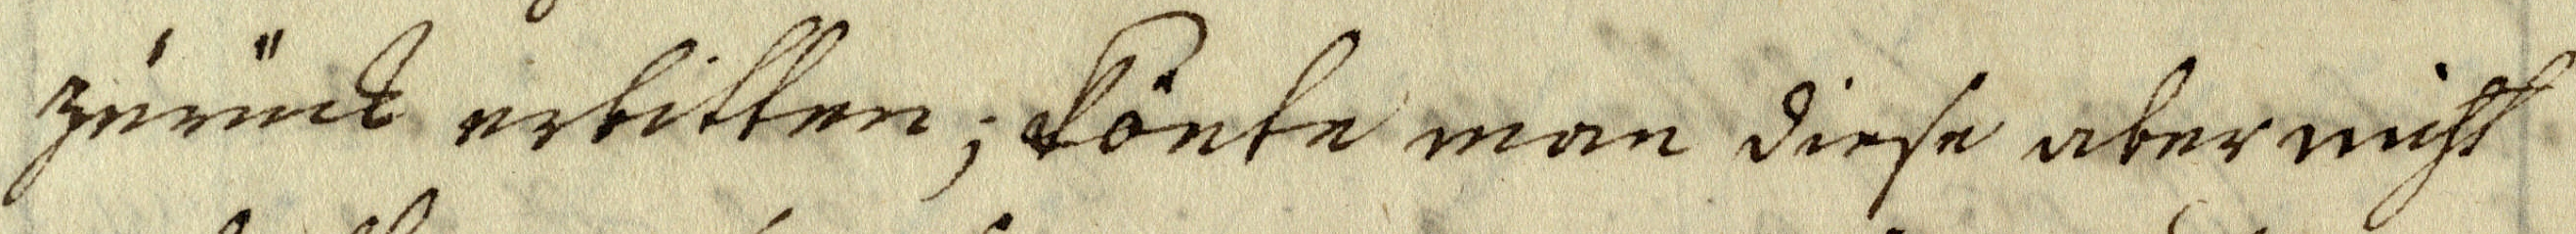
zurück erbitten; könte man diese aber nicht
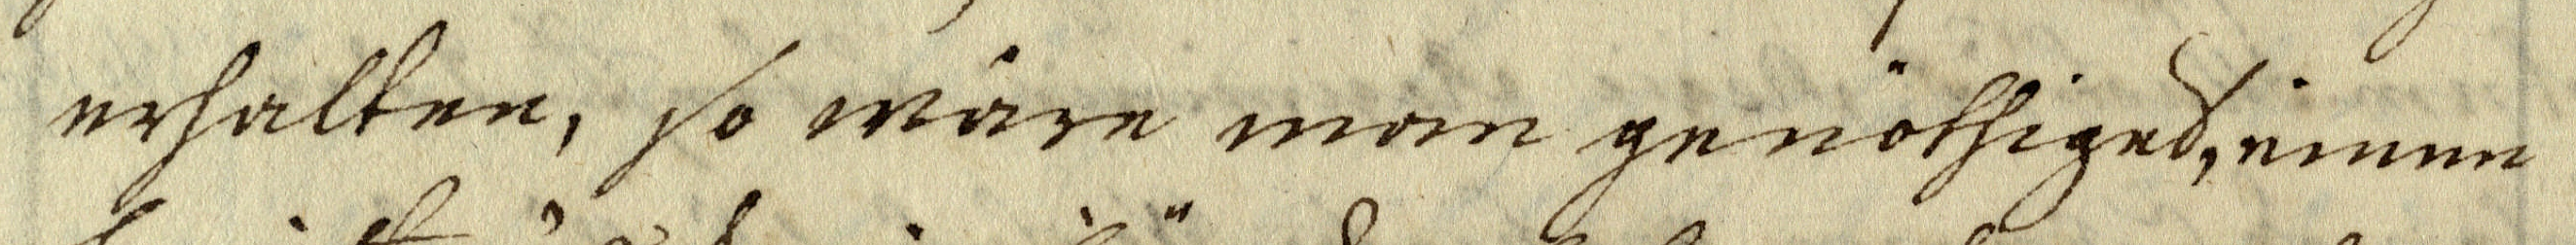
erhalten, so wäre man genöthiget, einen
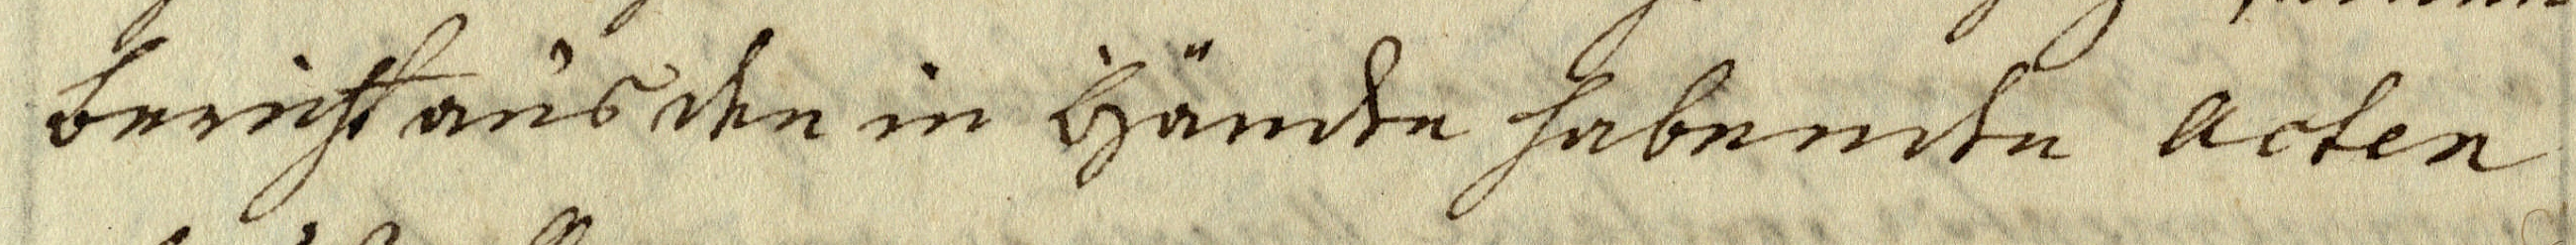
Bericht aus den in Händen habenden Acten
